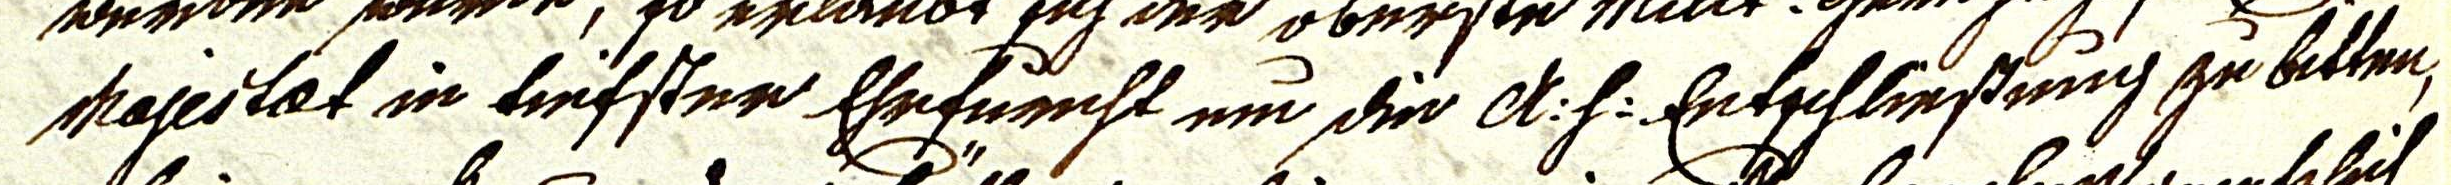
Majestæt in tiefster Ehrfurcht um die A: h: Entschließung zu bitten,
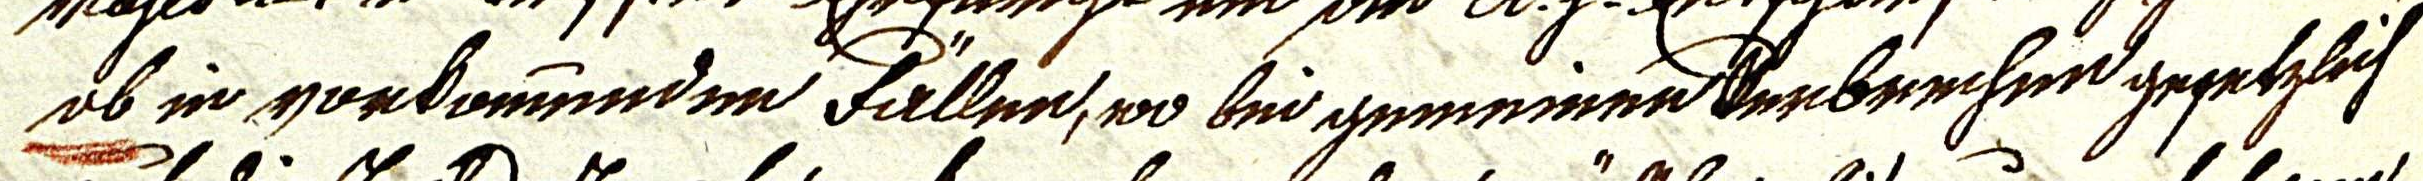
ob in vorkommenden Fällen, wo bin gemeinen Verbrechen gesetzlich
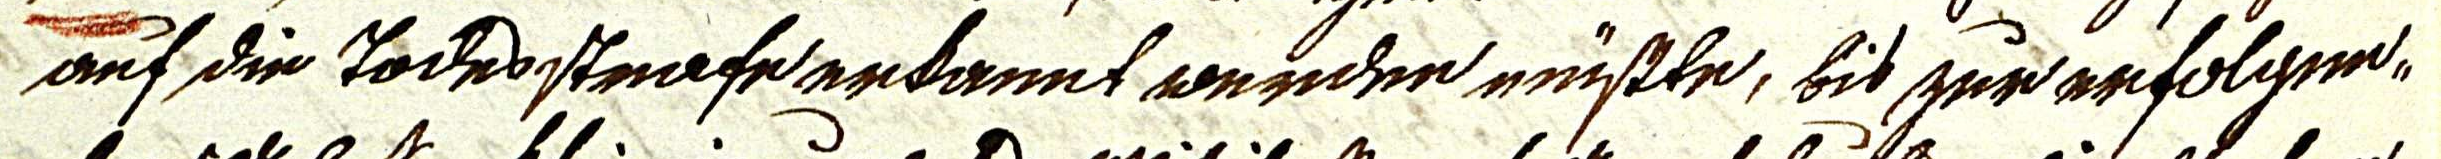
auf die Todesstrafe erkannt werden müßte, bis zur erfolgen¬
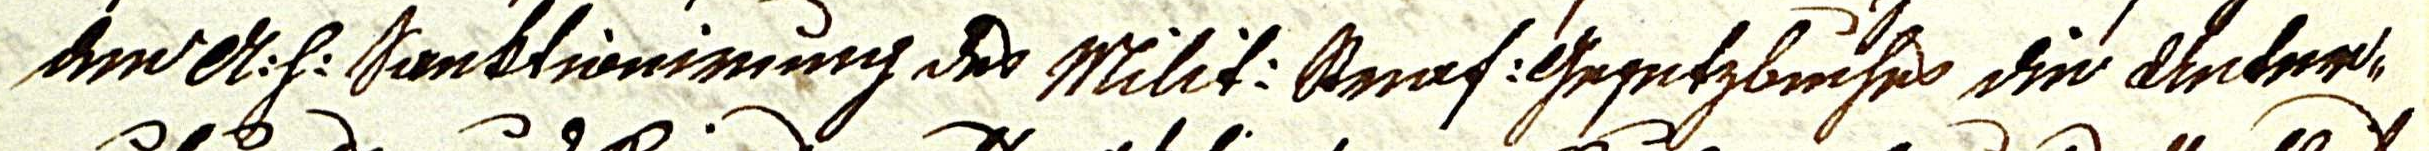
den A: h: Sanktionirung des Milit: Straf: Gesetzbuches die Unter¬
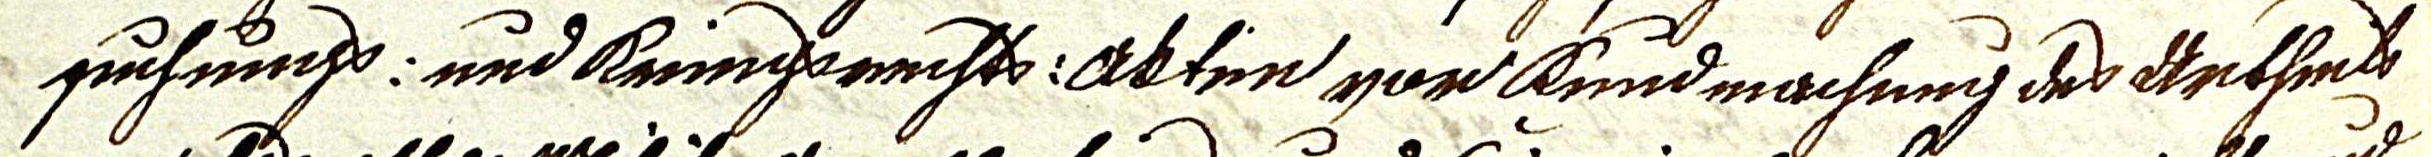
suchungs: und Kriegsrechts: Akten vor Kundmachung des Urtheils
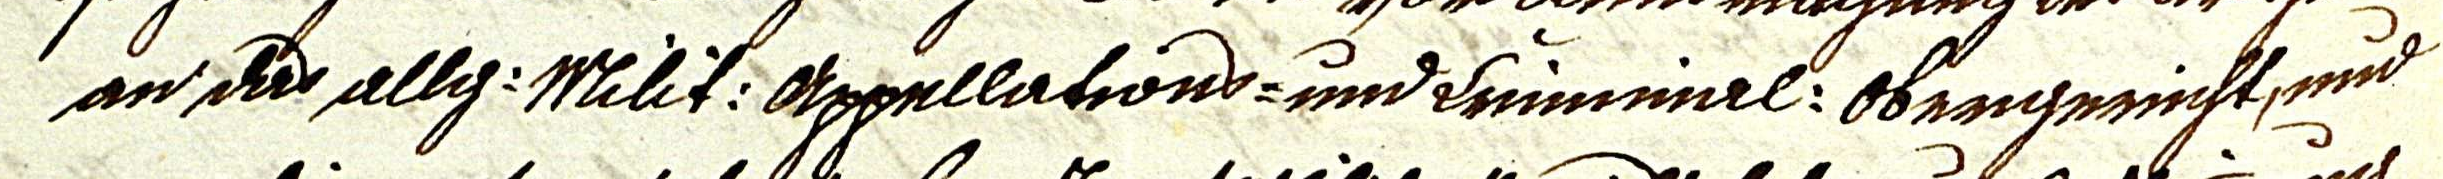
an das allg: Milit: Appellations= und Criminal: Obergericht, und
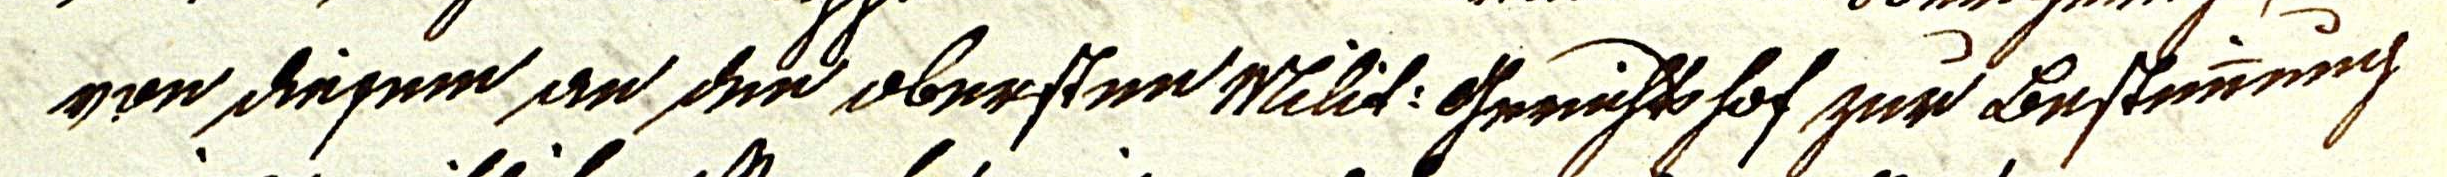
von diesem an den obersten Milit: Gerichtshof zur Bestimmung
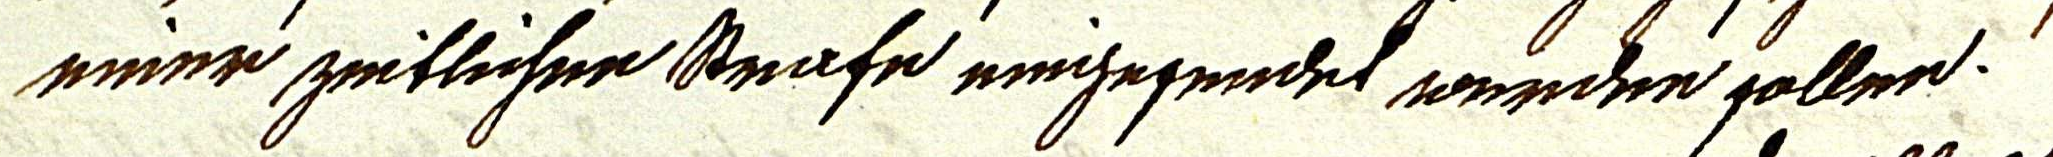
einer zeitlichen Strafe eingesendet werden sollen.
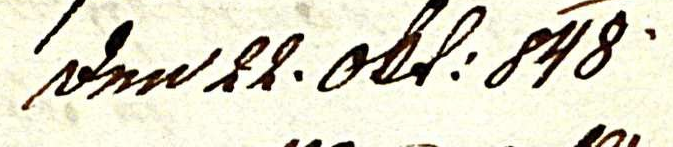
Den 22. Okt: 848.
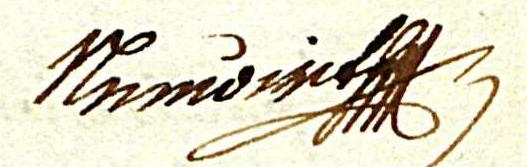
Neuwirthxx
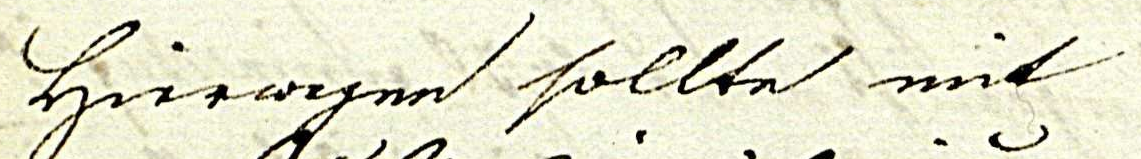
Hierwegen sollte mit
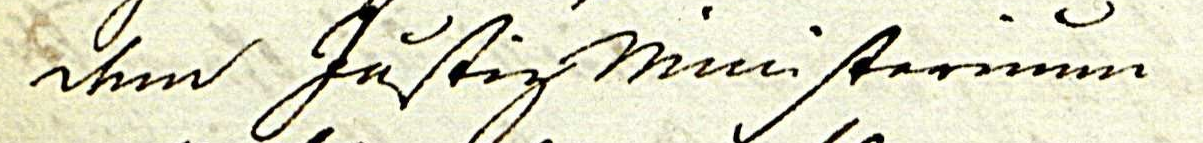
dem Justiz Ministerium
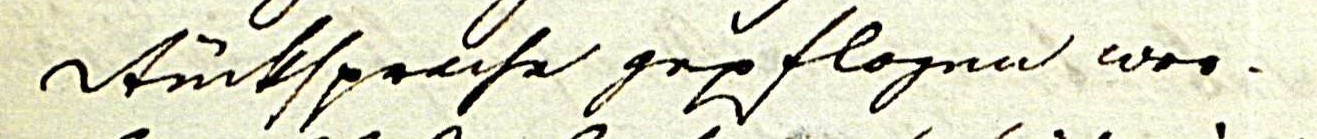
Stücksprache gepflogen wer¬
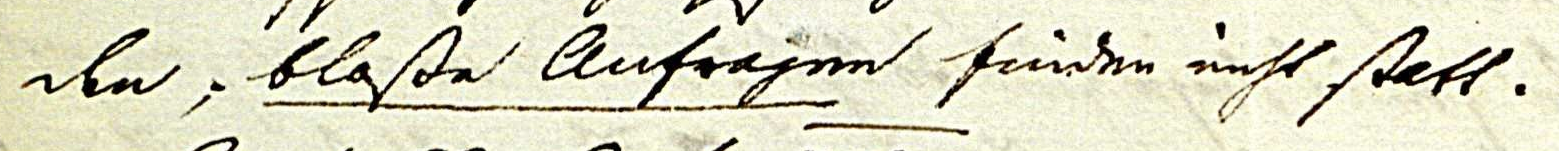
den; bloße Anfragen finden nicht statt.
